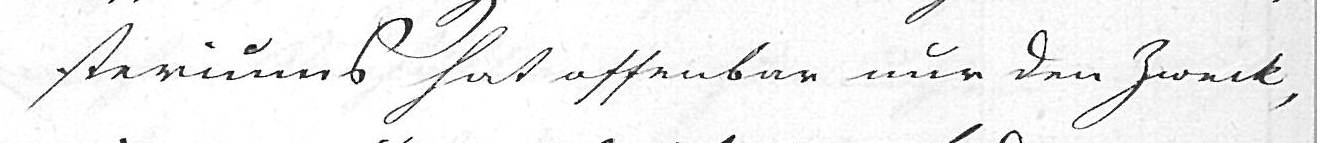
steriums hat offenbar nur den Zweck,
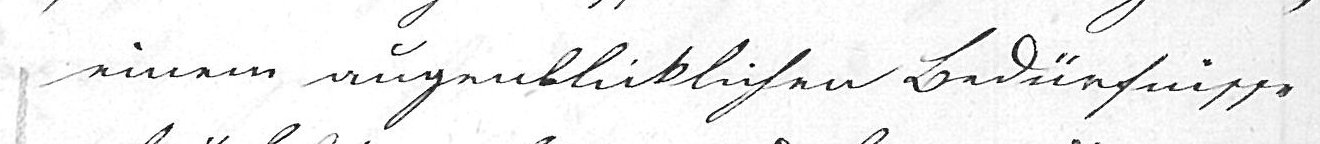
einem augenblicklichen Bedürfnisse
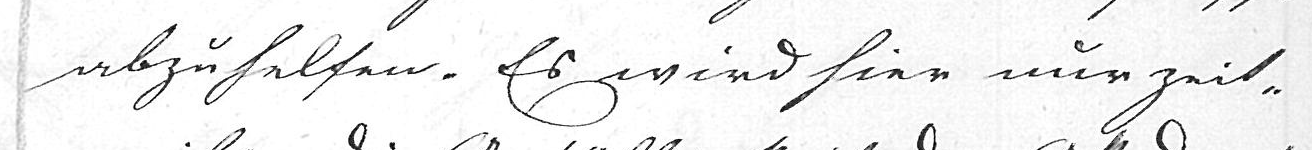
abzuhelfen. Es wird hier nur zeit-
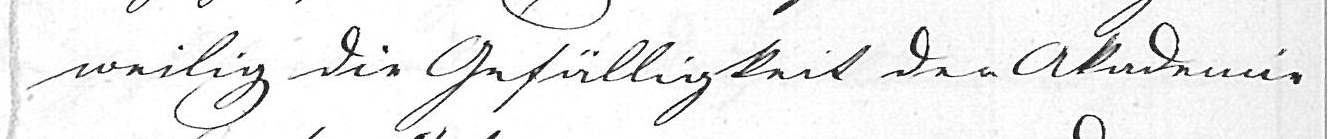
weilig die Gefälligkeit der Akademie
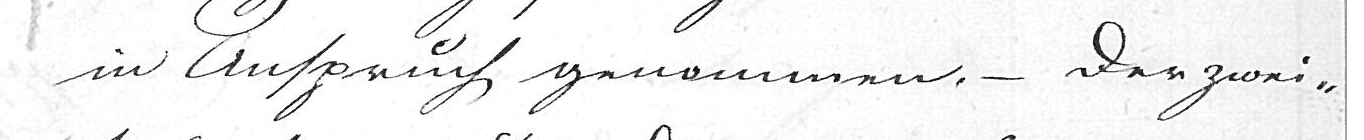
in Anspruch genommen. - Der zwei-
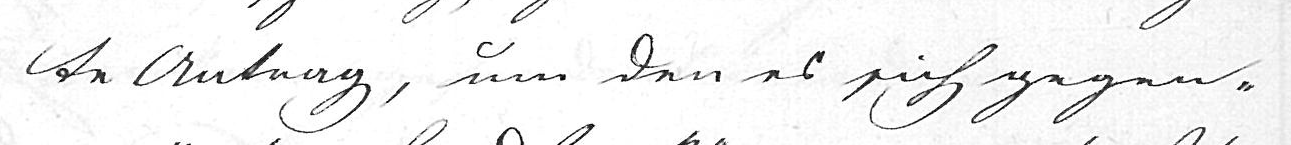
te Antrag, um den es sich gegen-
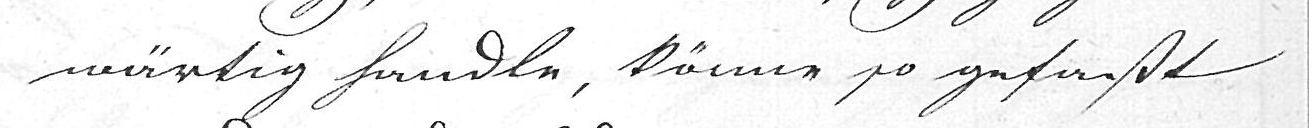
würdig handle, könne so gefaßt
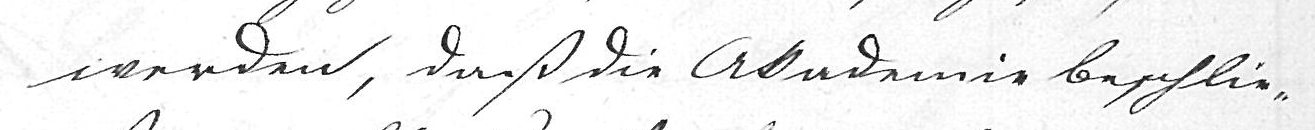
werden, daß die Akademie beschlie-
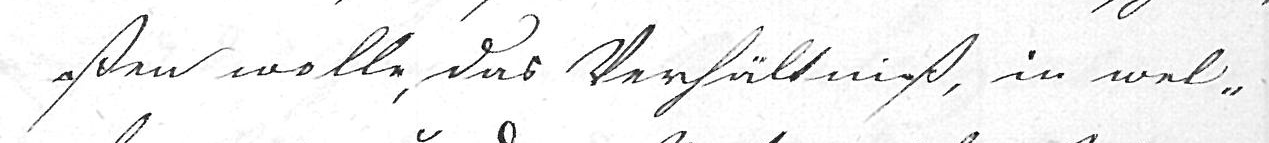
ßen wolle, des Verhältniß, in wel-
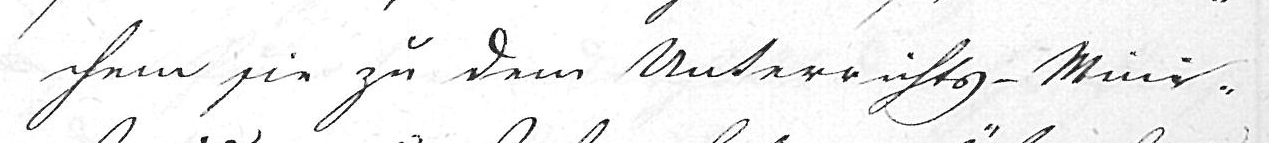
chem sie zu dem Unterrichts-Mini-
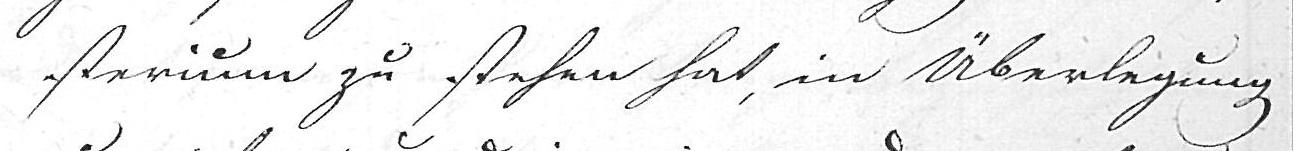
sterium zu stehen hat, in Überlegung
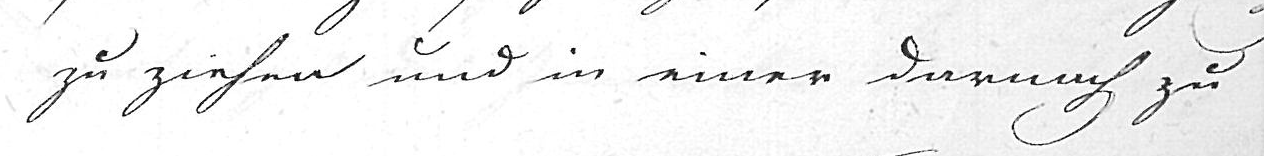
zu ziehen und in einer darnach zu
